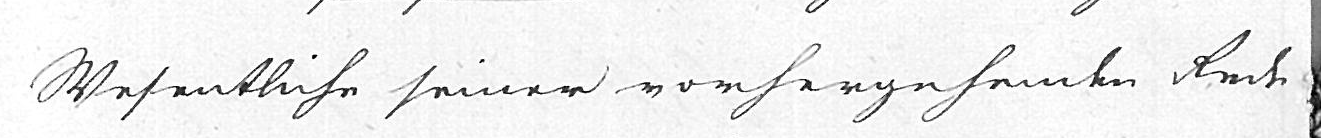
Wesentliche seiner vorhergehenden Rede
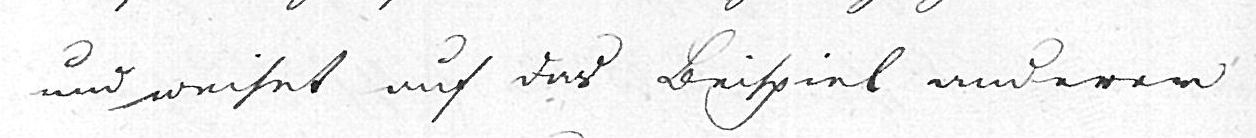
und weiset auf das Beispiel anderer
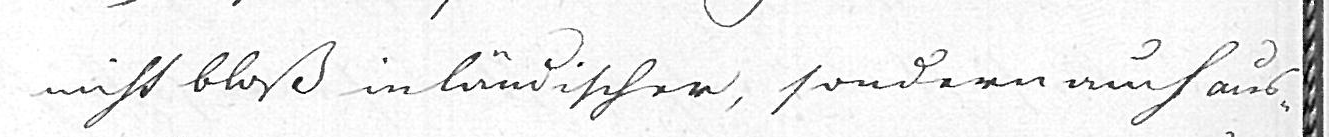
nicht bloß inländicher, sondern auch aus-
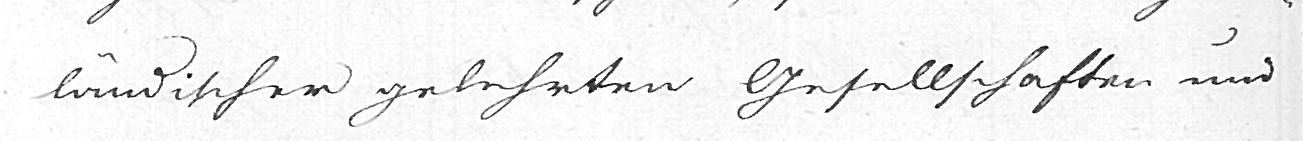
ländischer gelehrten Gesellschaften und
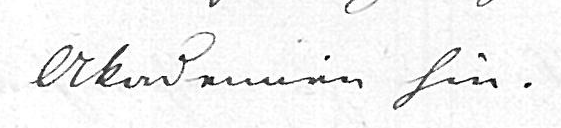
Akademien hin.
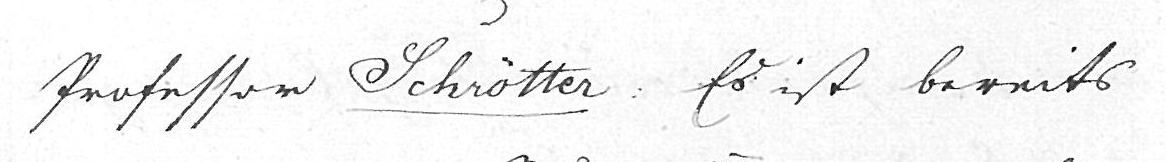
Professor Schrötter: Es ist bereits
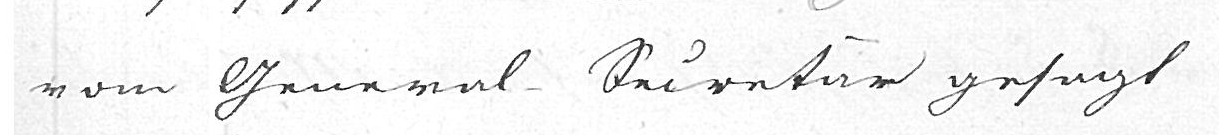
vom General-Secretär gesagt
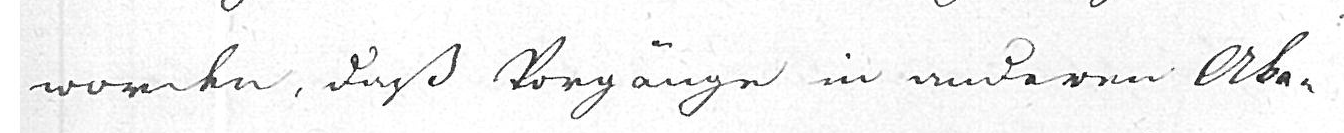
worden, daß Vorgänge in anderen Aka-
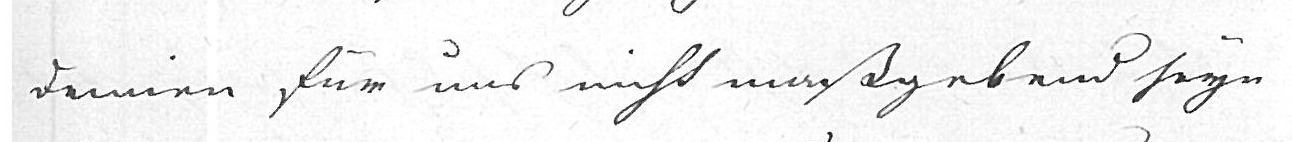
demien für uns nicht maßgebend seyn
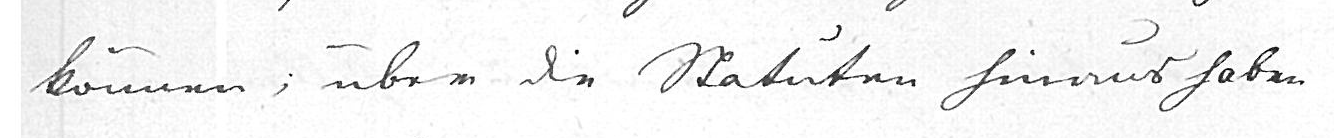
können, über die Statuten hinaus haben
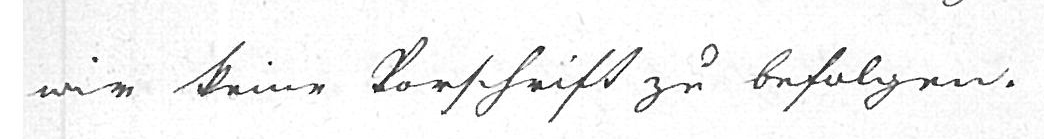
wir keine Vorschrift zu befolgen.
